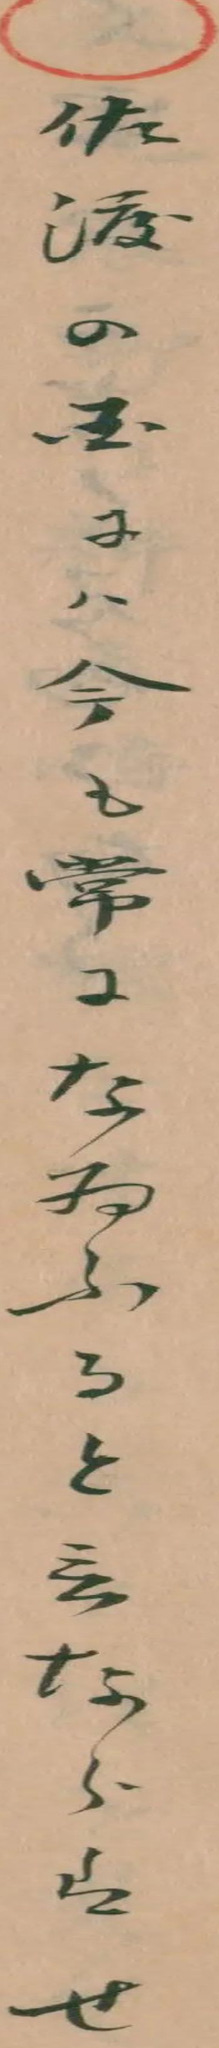〇佐渡の国には今も常になゐふると言ならはせ
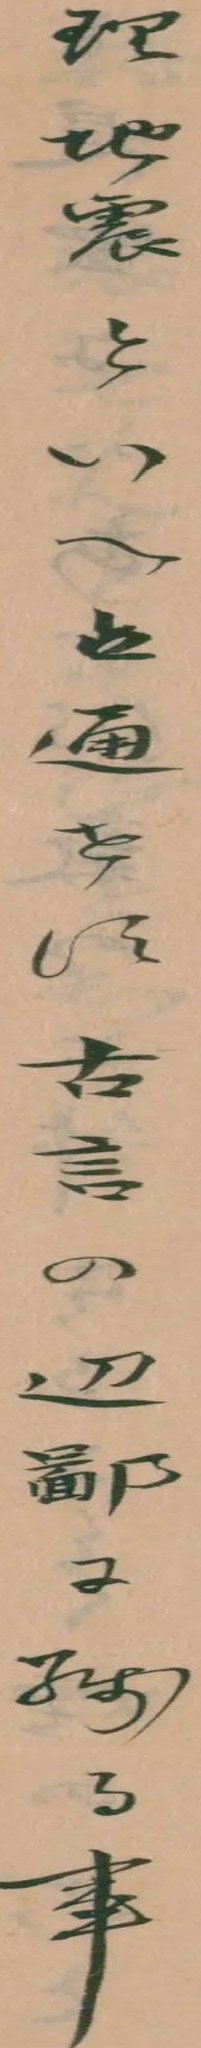り地震といへは通せす古言の辺鄙に残る事
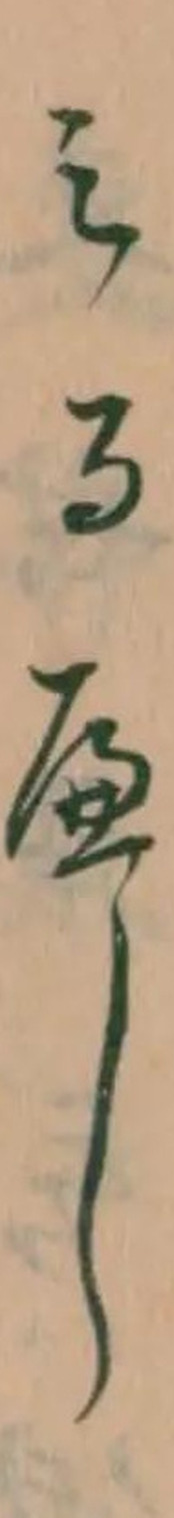しるへし
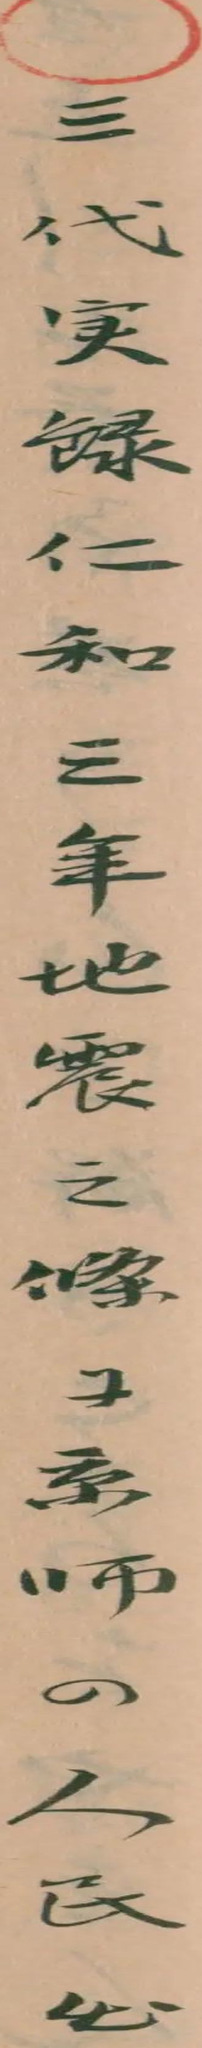〇三代実録仁和三年地震之條に京師の人民出
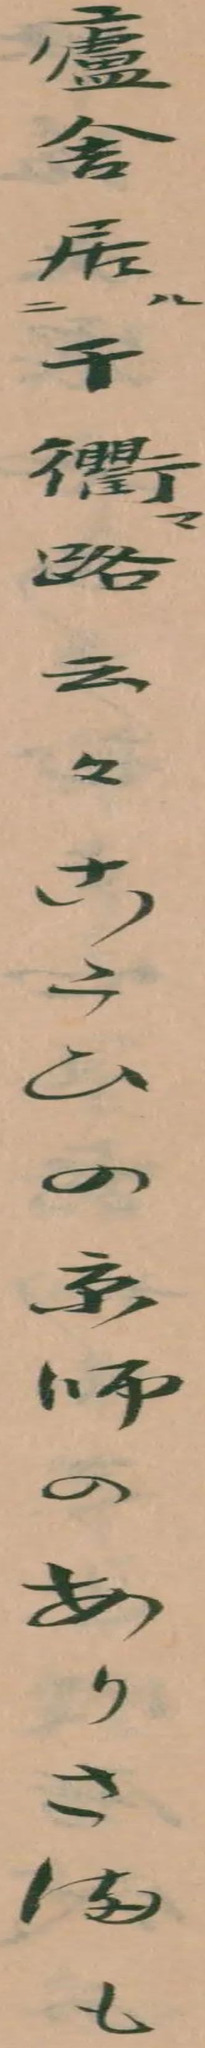庵舎居于衢路云々こたひの京師のありさまも
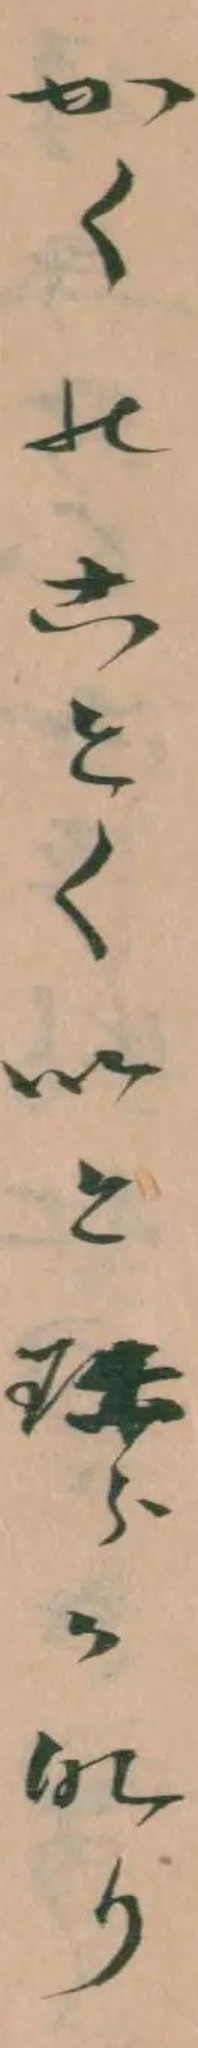かくのことくいと珎らかなり
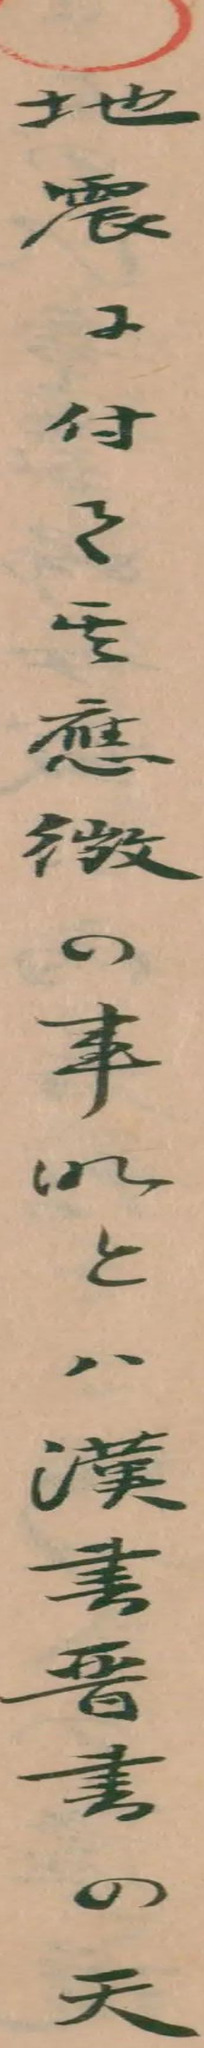〇地震に付て其応徴の事なとは漢書晋書の天
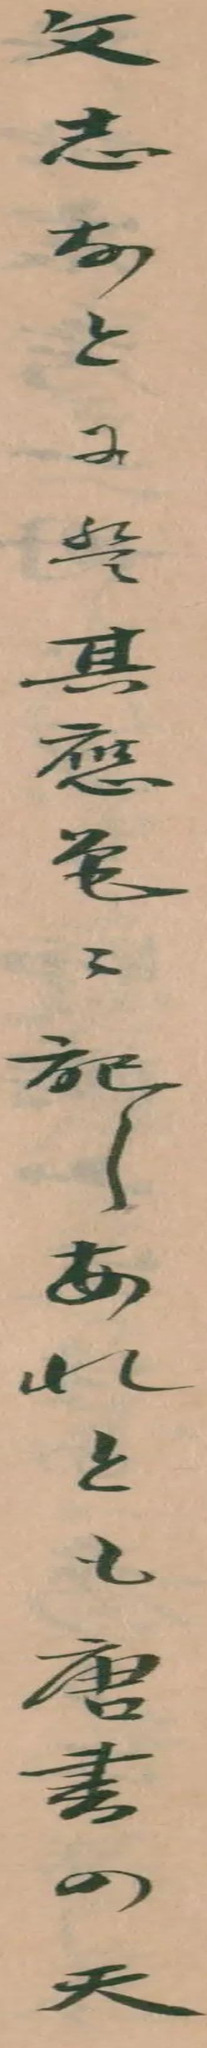文志なとには其応色々記しあれとも唐書の天
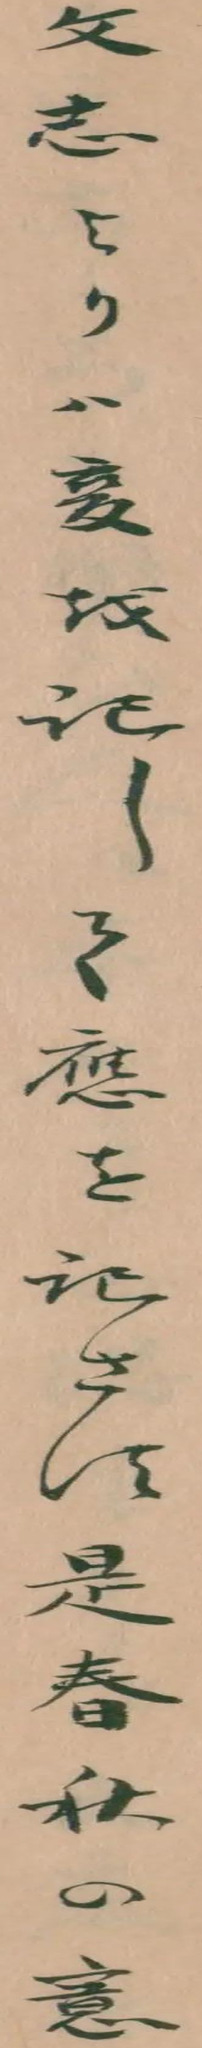文志よりは変を記して応を記さす是春秋の意
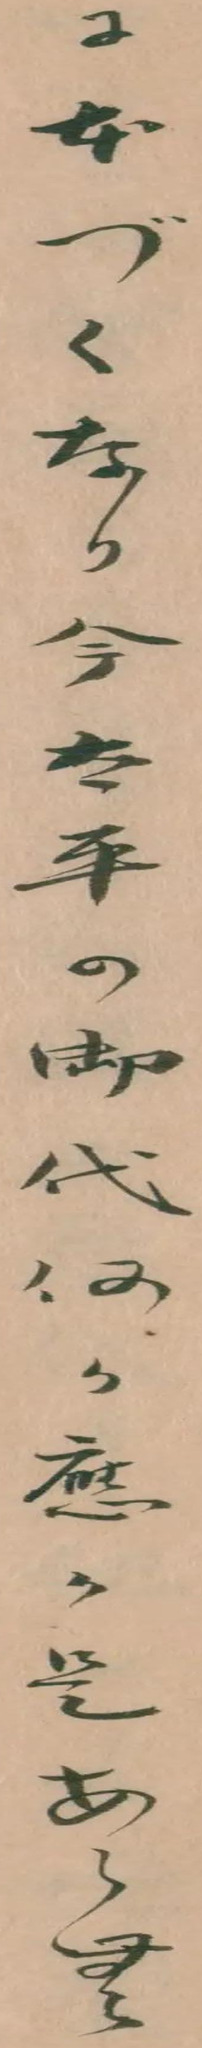に本づくなり今太平の御代何か応か是あらむ
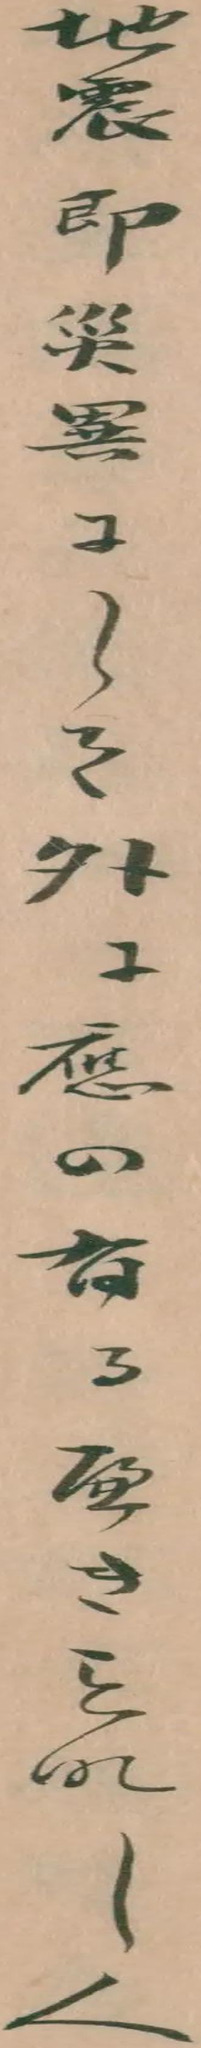地震即災異にして外に応の有るへきことなし人
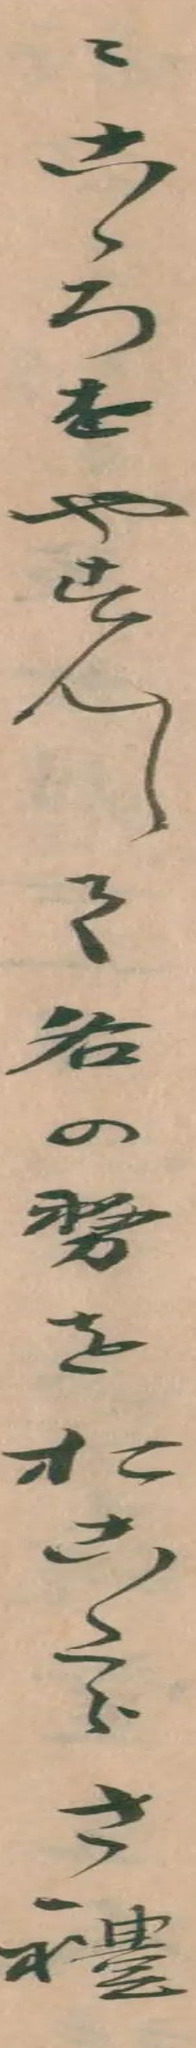々こころをやすんして各の務をおこたらされ

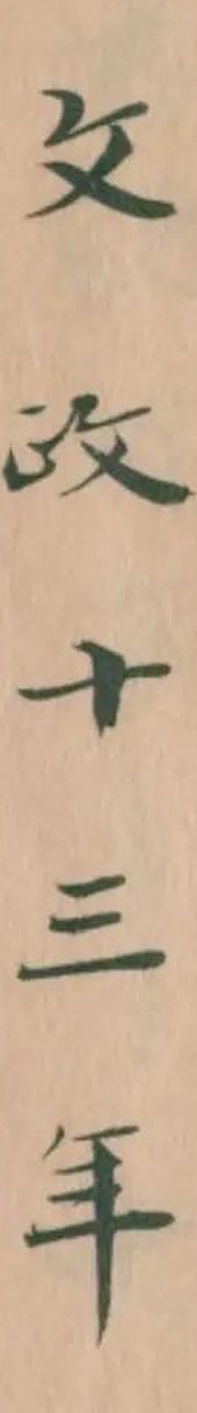文政十三年
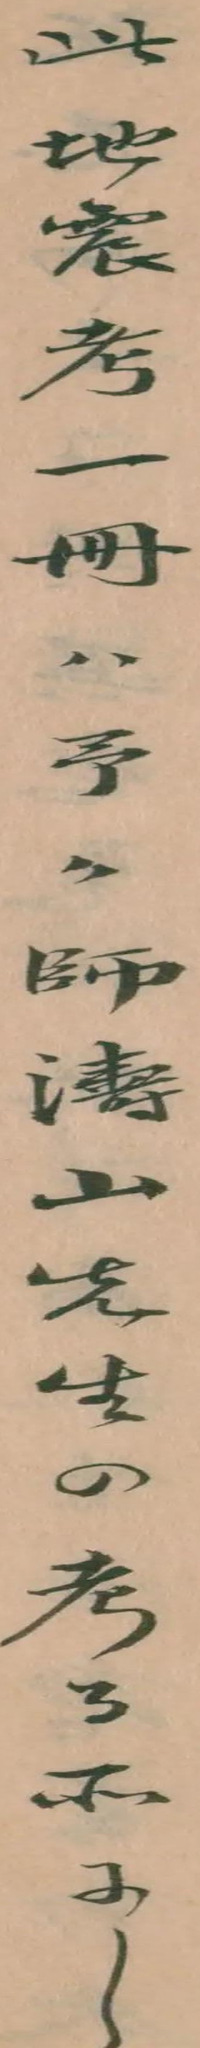此地震考一冊は予か師涛山先生の考る所にし
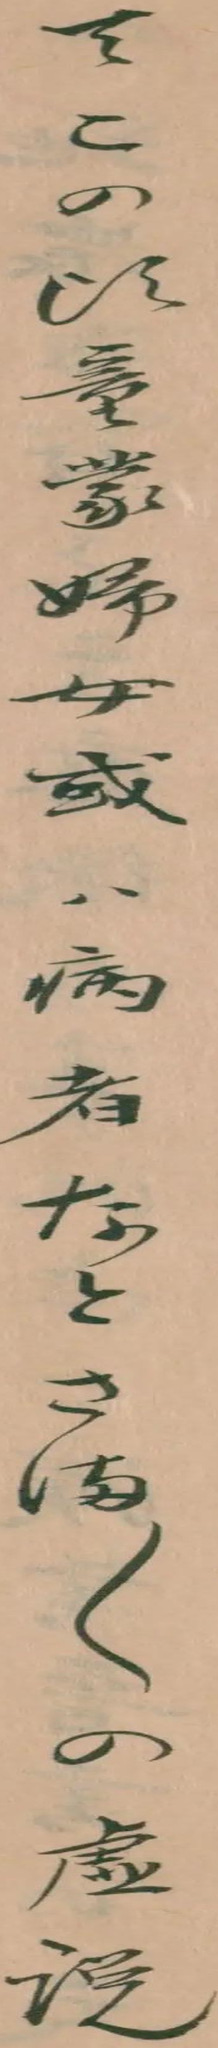てこの頃童蒙婦女或は病者なとさま〳〵の虚説
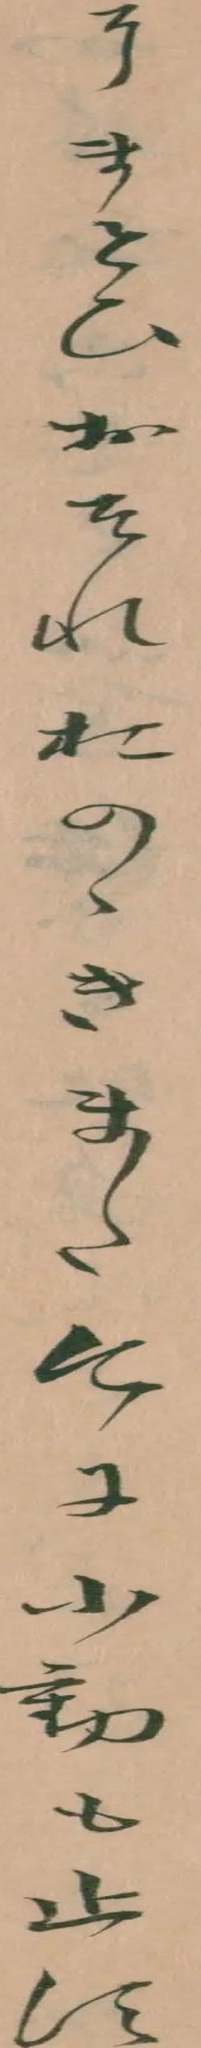にまとひおすれおのゝきまた今に小動も止す
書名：地災撮要. 巻5-6(地震之部)
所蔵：国立国会図書館 National Diet Library, JAPAN
